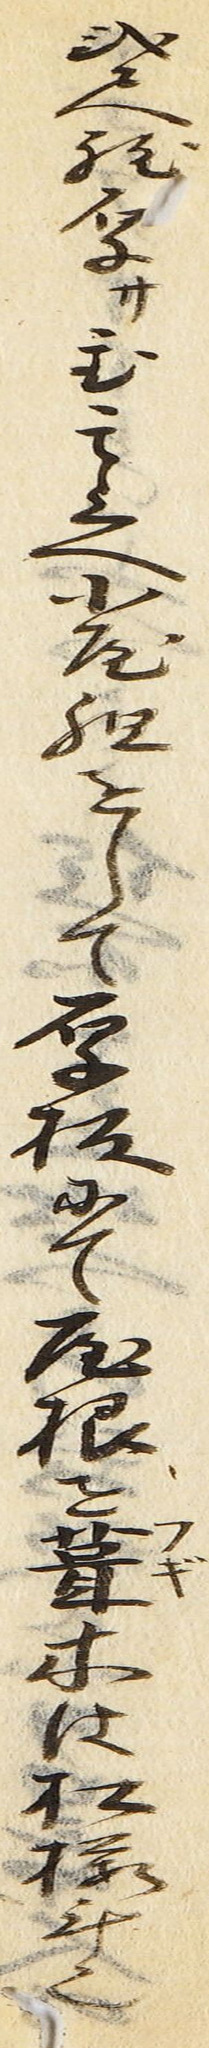弐尺程厚さ置其上へ小屋組をして厚板にて屋根を葺木は松桜計也
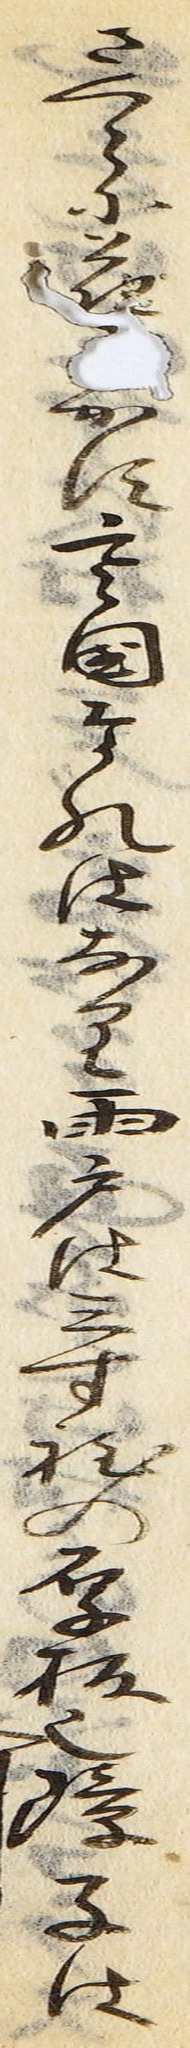さくらに花かす寒国なれはなり雨戸は三寸程の厚板也障子は
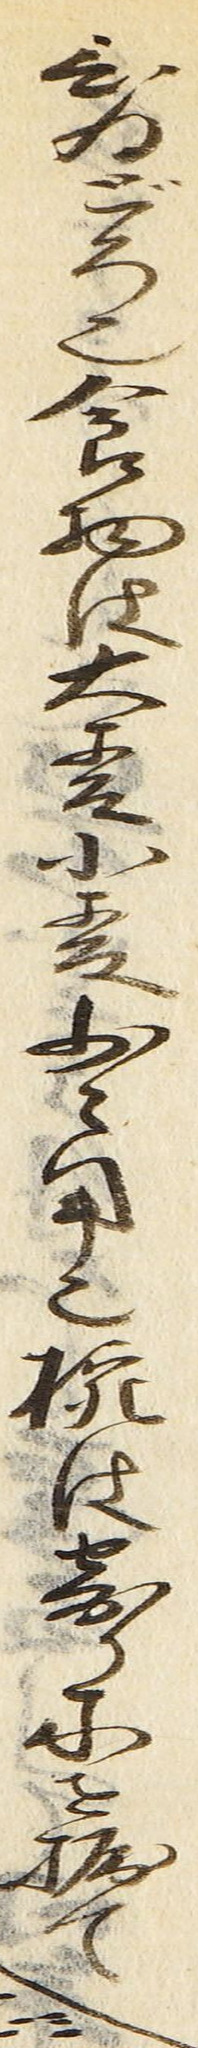ひゐどろ也食物は大麦小麦少々用也椀は寄り木を掘て
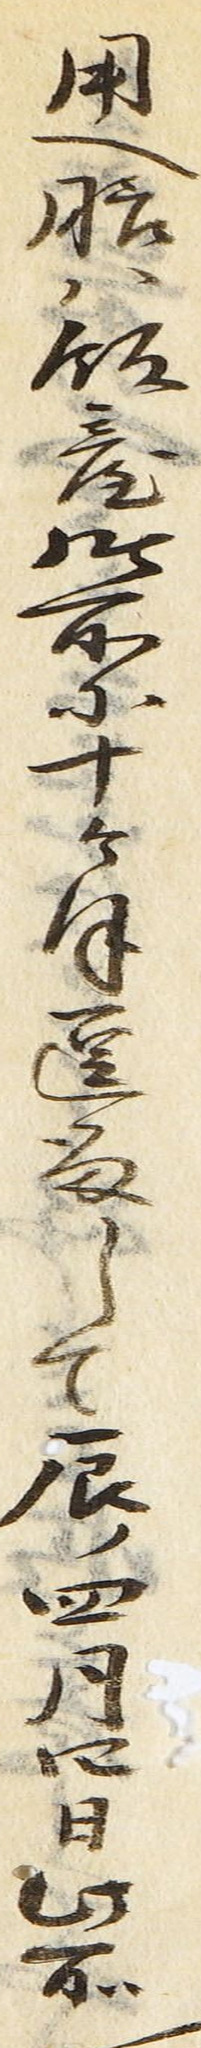用へ膳は飯台此所に十ヶ月逗留して辰ノ四月四日此所
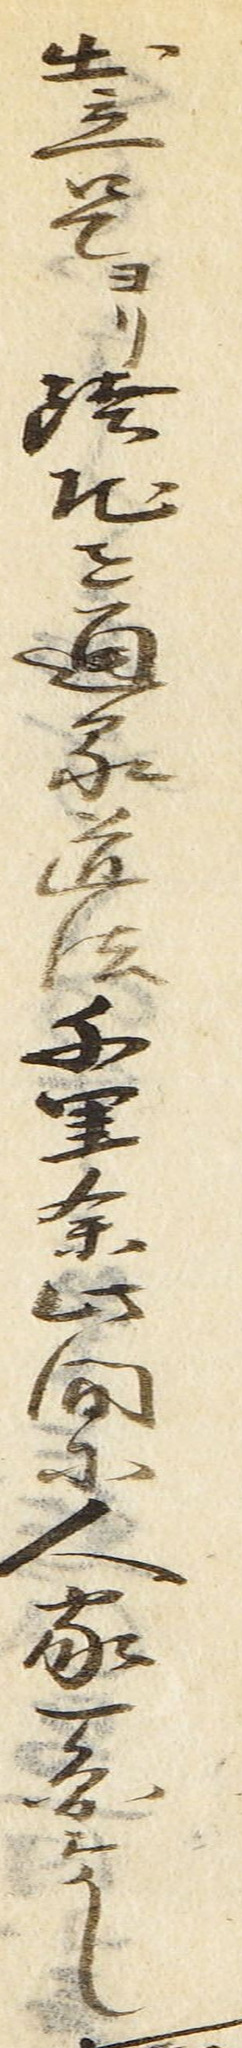出立是より陸地を通る道法千里余此間に人家一円なし
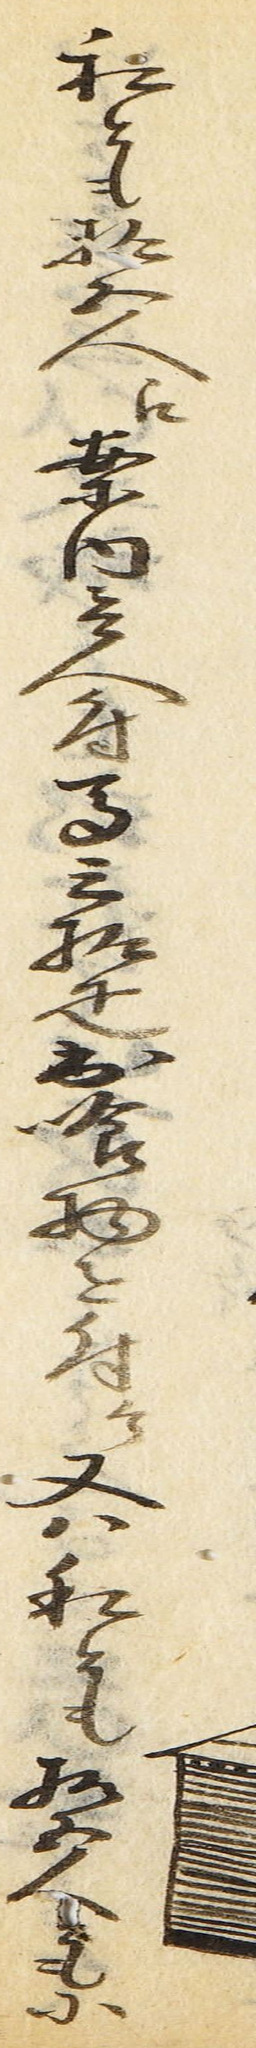私とも拾五人え案内壱人付馬三拾疋出喰物を付け又は私とも拾五人ともに
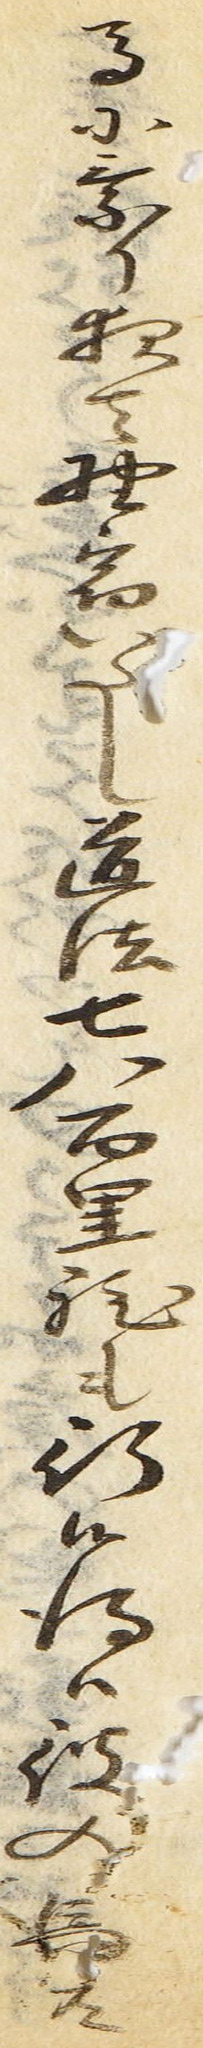馬に乗り夜は野宿いたし道法七八百里程も行候得は彼の馬共
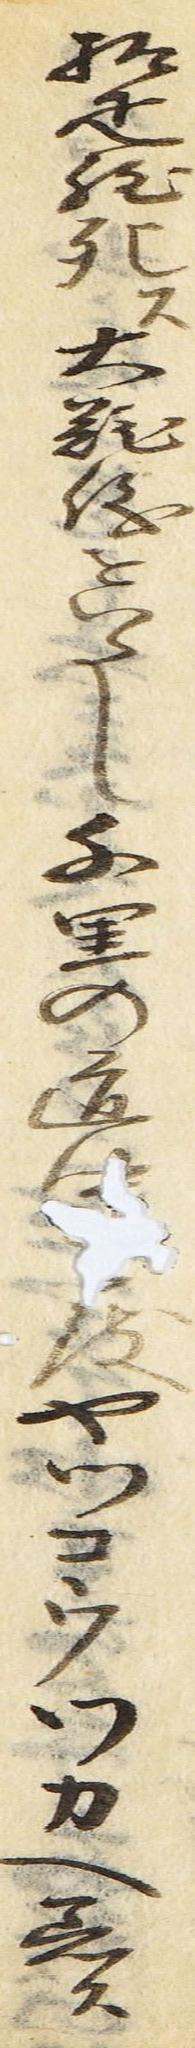拾疋程死す大難義をいたし千里の道法度ヤツコウツカへ着す
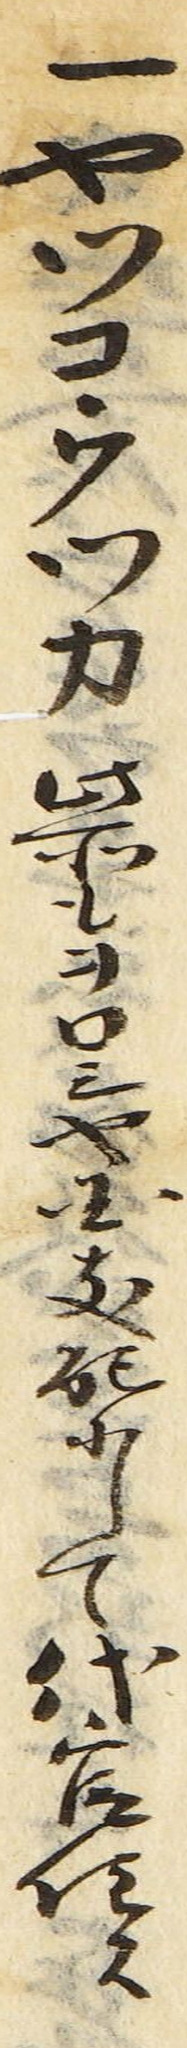一ヤツコウツカ此所もヲロシヤ国支配にして代官住す

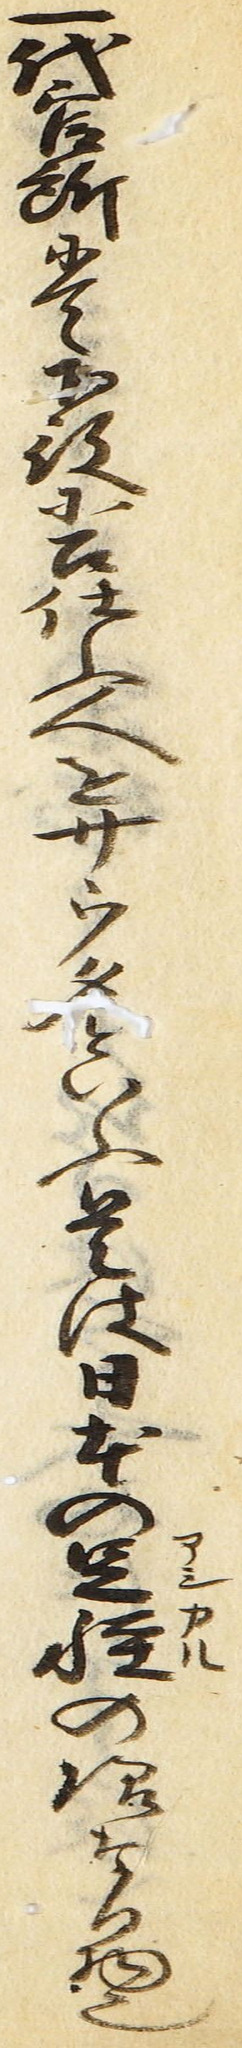一代官所にて下役に召仕ふ人をサウタといふ是は日本の足軽の様なる物也
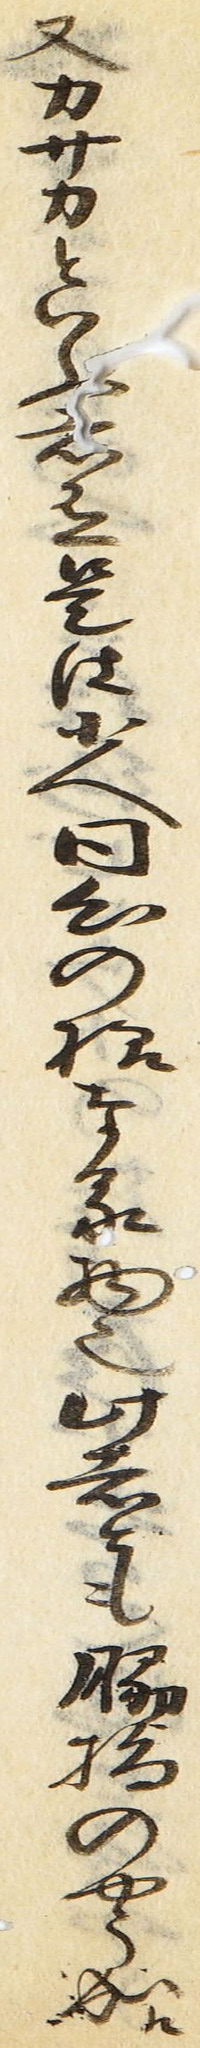又カサカといふ者有是は小人同心の様なる物也此者とも脇指のやう成る
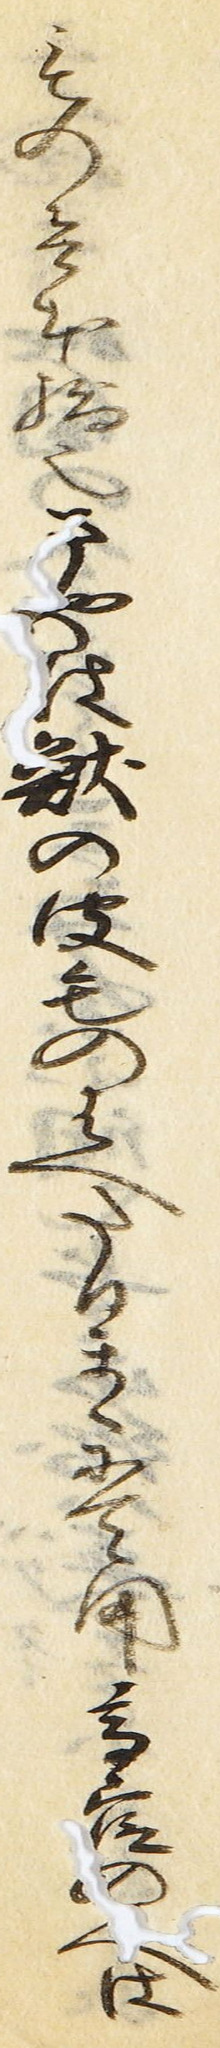もの壱本指也さやは獣の皮毛のはへたるまゝにて用高官の人は
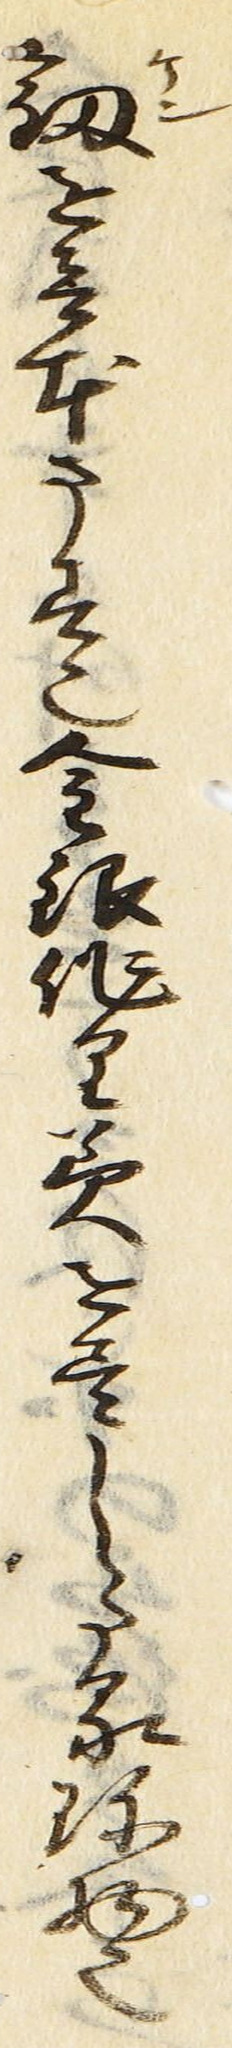釼を壱本さす也金銀作り美を尽したる珍物也
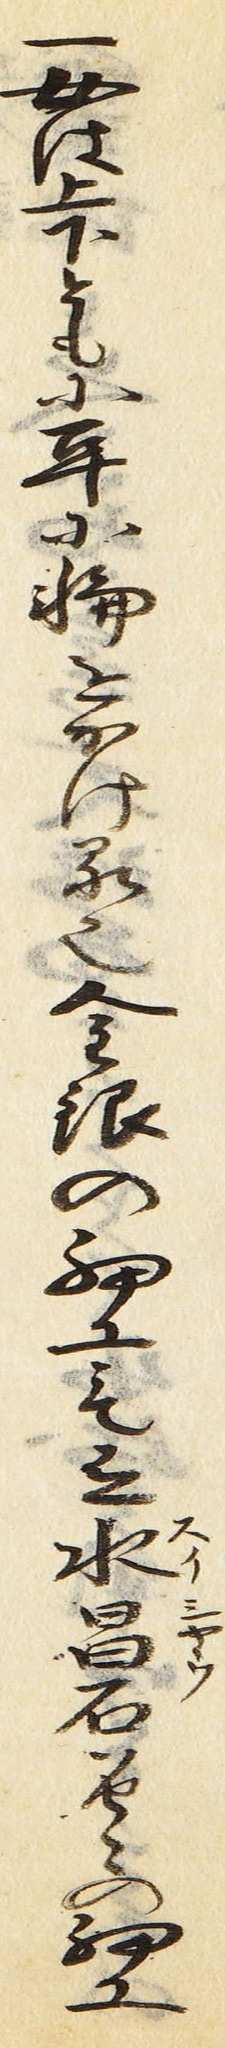一女は上下ともに耳に輪をかける也金銀の細工も有水昌石色々の細工
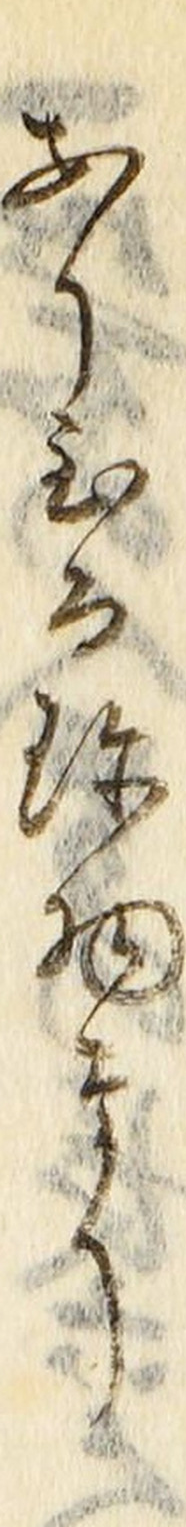あり至而珍物なり
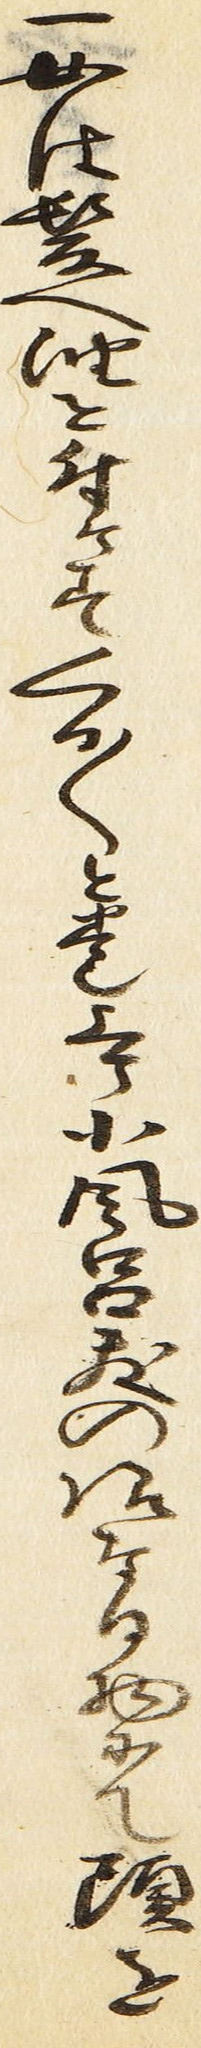一女は髪へ油を付けすくる〳〵と巻揚け小風呂敷の様なる物にて頭を
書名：外国漂流記
